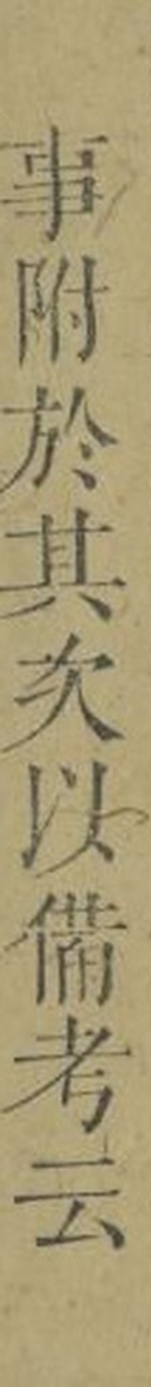事附於其次以備考云
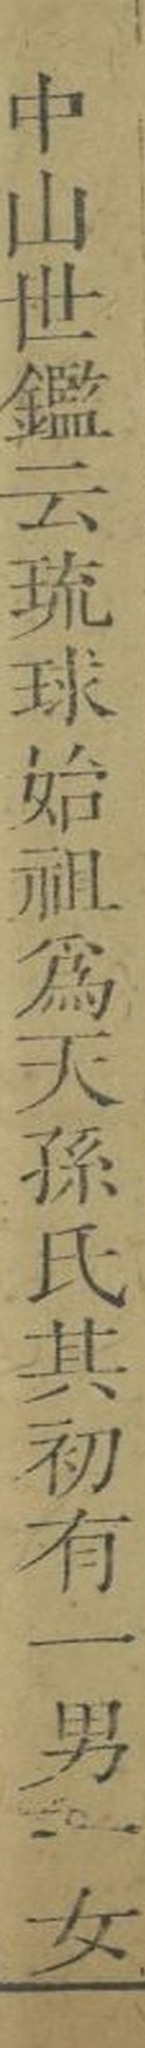中山世鑑云琉球始祖為天孫氏其初有一男一女
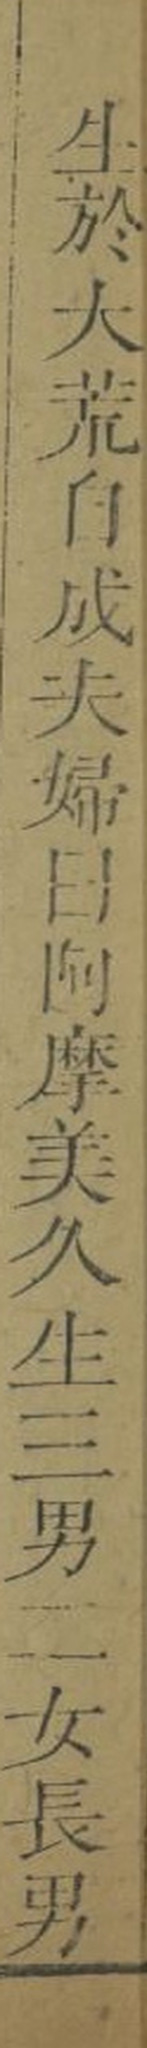生於大荒自成夫婦曰阿摩美久生三男二女長男
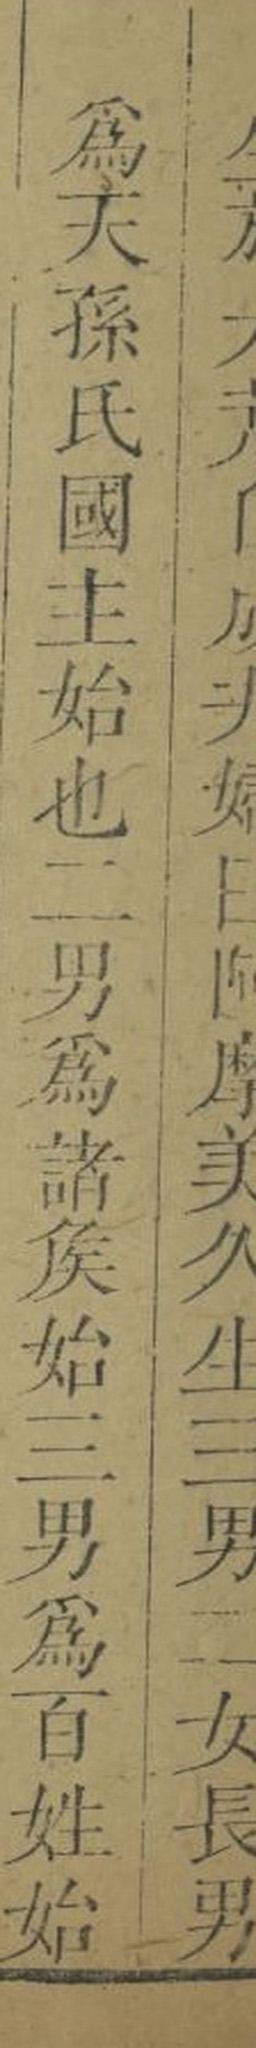為天孫氏国主始也二男為諸侯始三男為百姓始
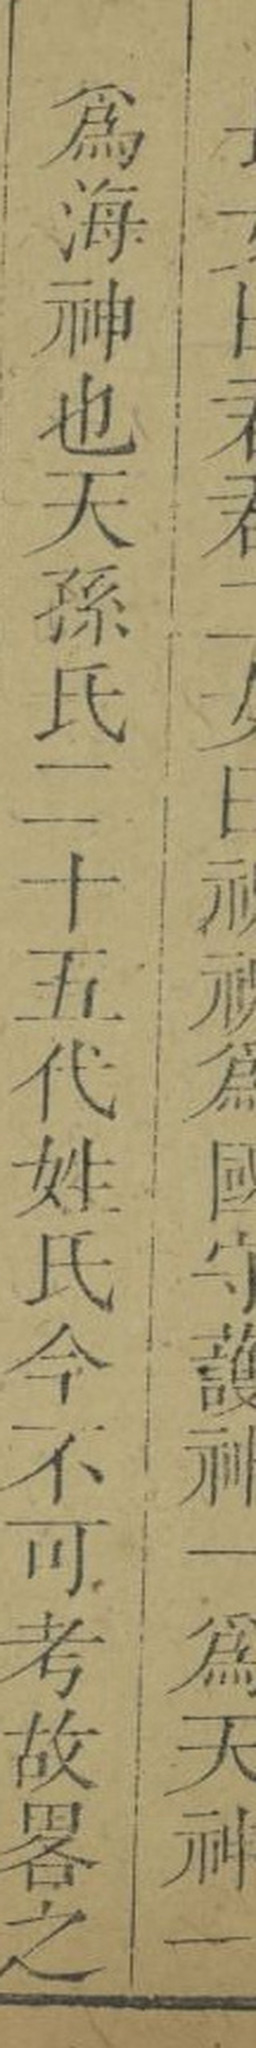為海神也天孫氏二十五代姓氏今不可考故略之
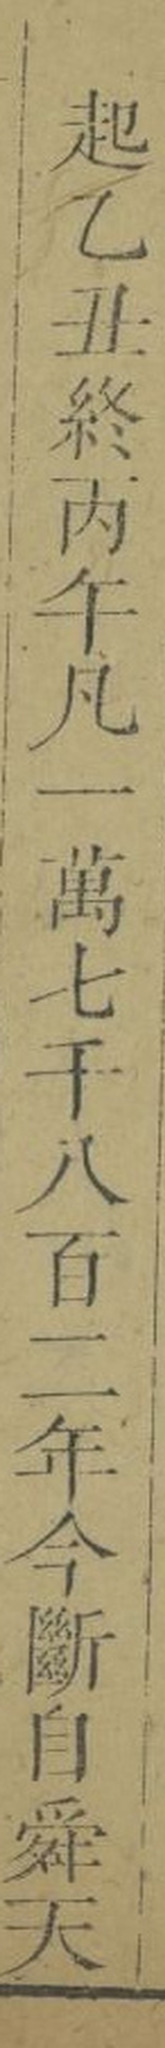起乙丑終丙午凡一万七千八百二年今断自舜天
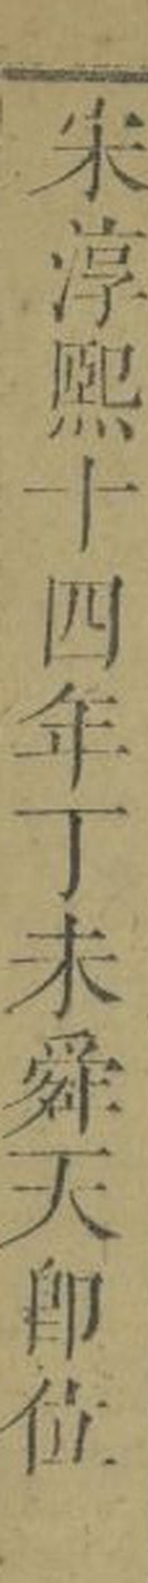宋淳熙十四年丁未舜天即位
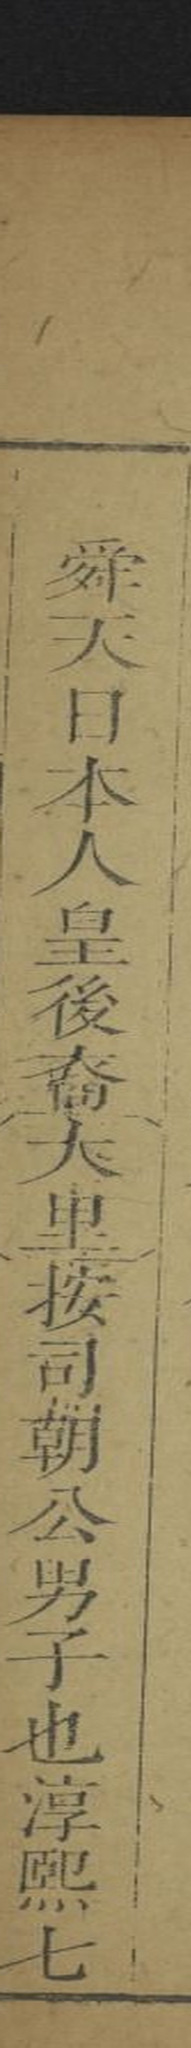舜天日本人皇後裔[大里]按司朝公男子也淳熙七

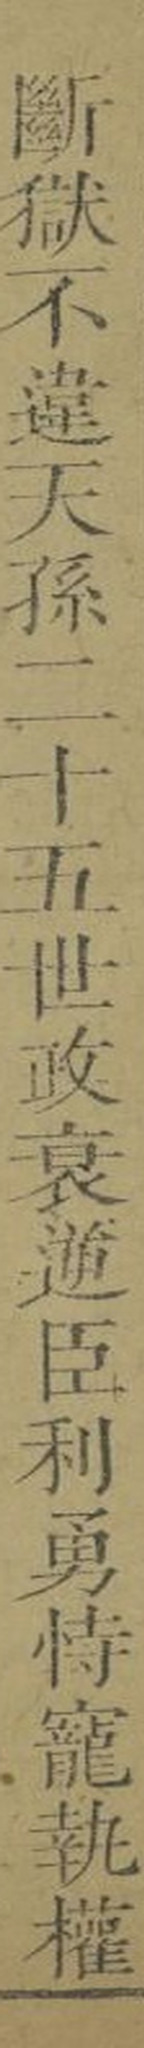断獄不違天孫二十五世政衰逆臣利勇恃寵執権
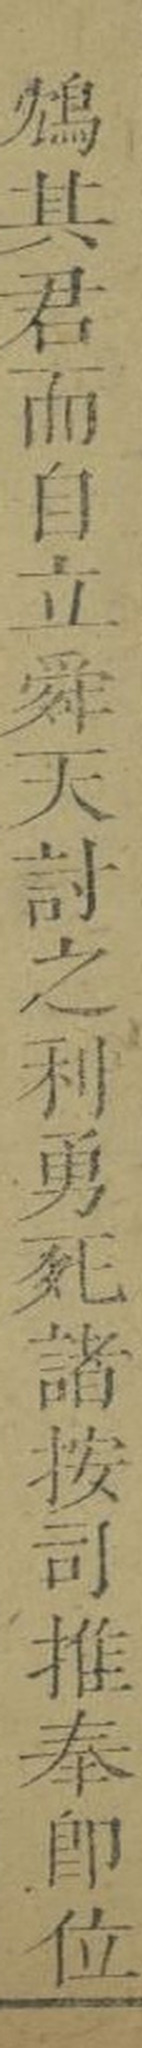鴆其君而自立舜天討之利勇死諸按司推奉即位
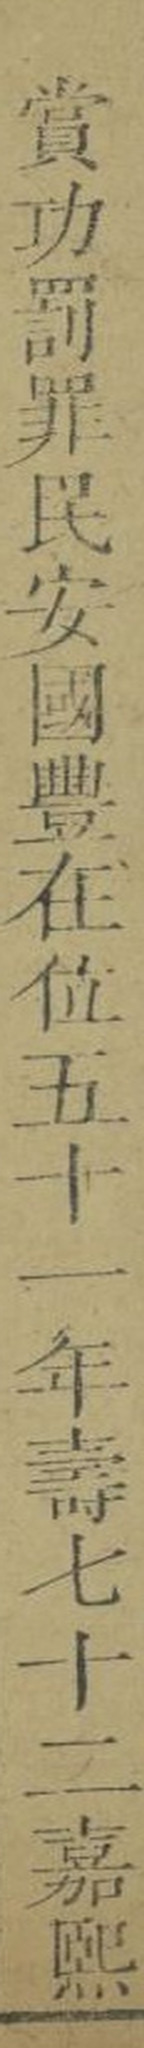賞功罰罪民安国豊在位五十一年寿七十二嘉熙
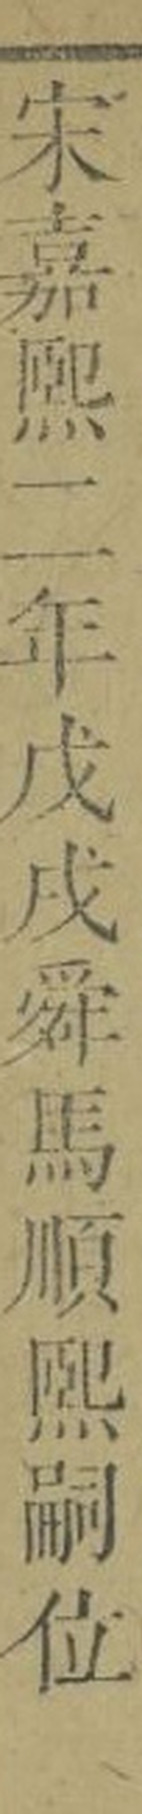宋嘉熙二年戊戌舜馬順熙嗣位
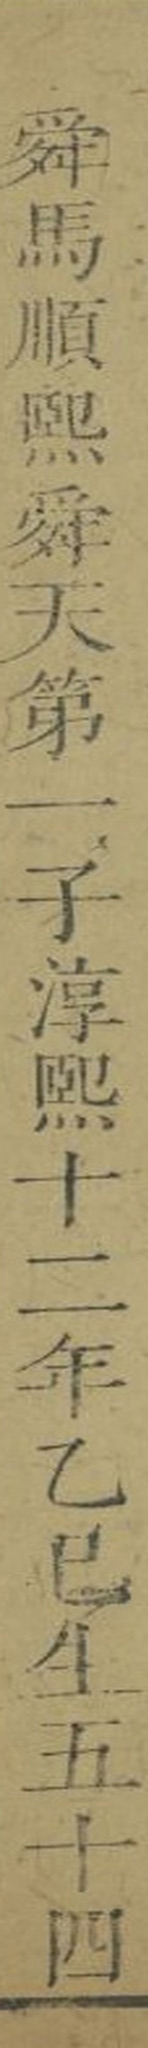舜馬順熙舜天第一子淳熙十二年乙巳生五十四
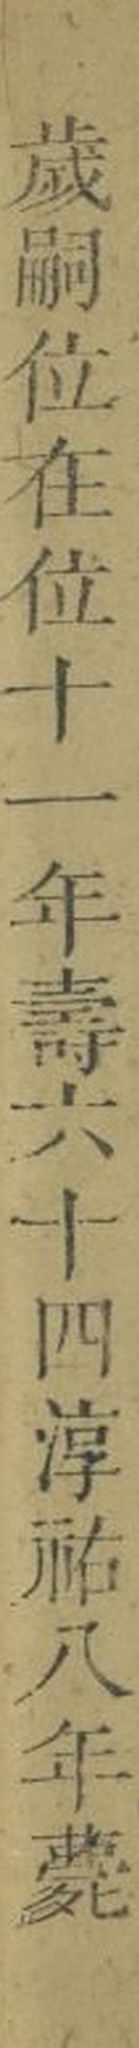歳嗣位在位十一年寿六十四淳祐八年薨
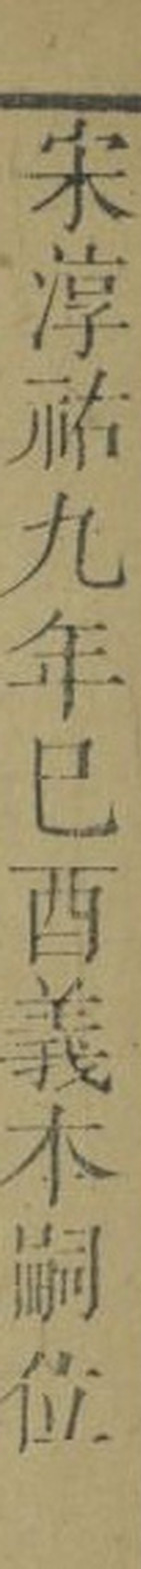宋淳祐九年巳酉義本嗣位
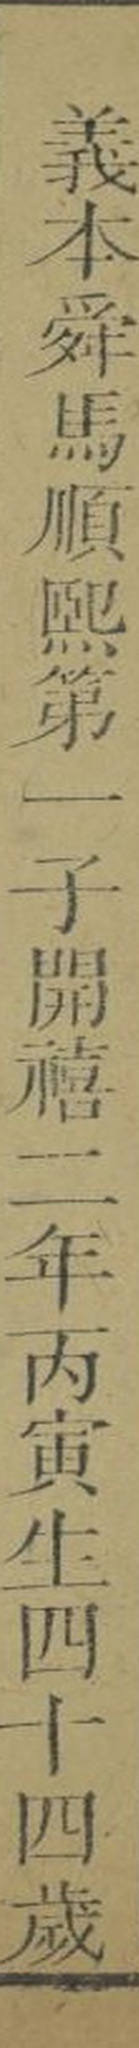義本舜馬順熙第一子開禧二年丙寅生四十四歳
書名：中山伝信録 巻三
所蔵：University of the Ryukyus Library
